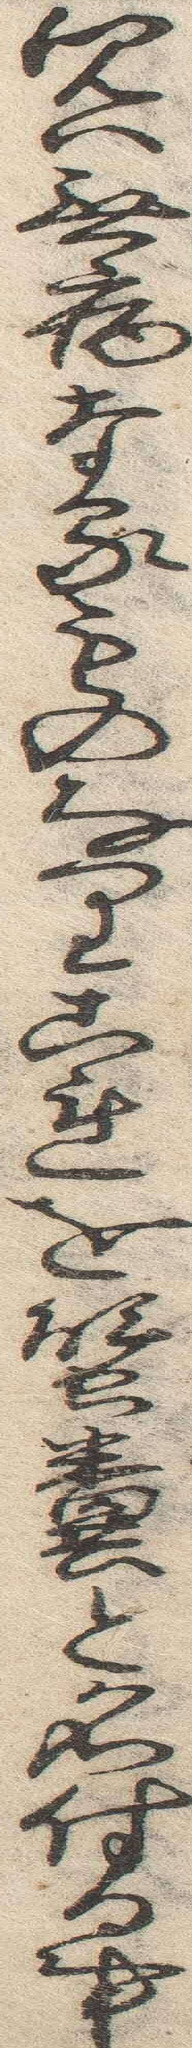児は無病なるものなりこれを蟹糞と名付る事
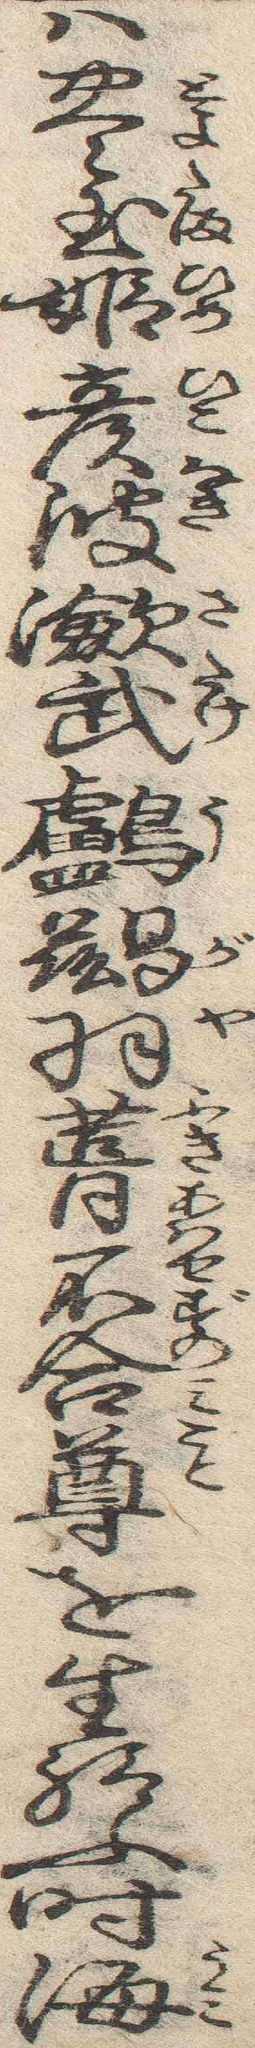は豊玉姫彦波㶑武鸕鷀羽葺不合尊を生給ふ時海
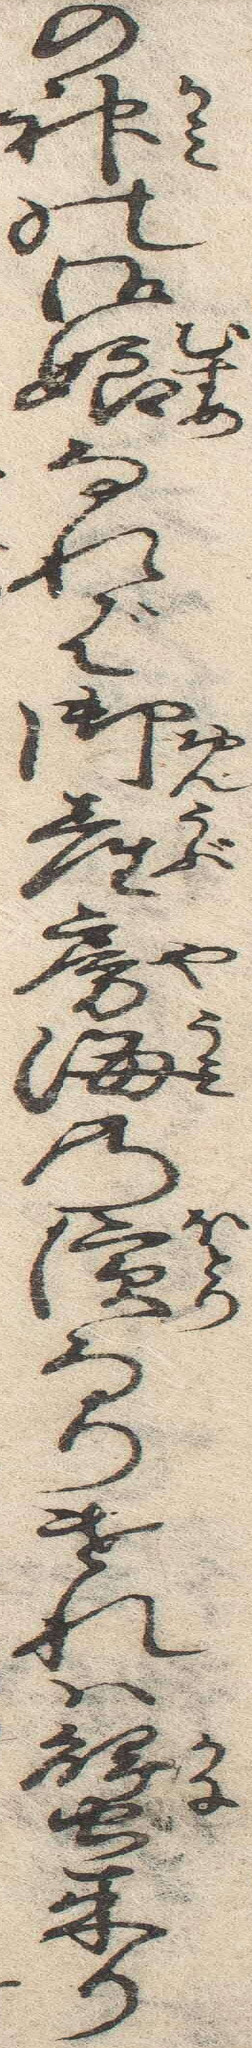の神の御娘なれば御産房海の濱なりけれは蟹來り
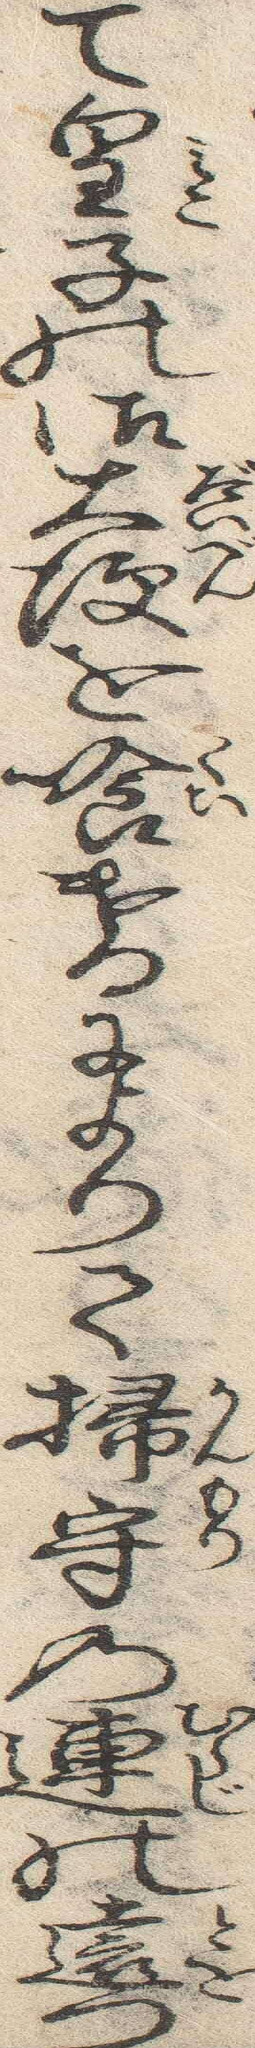て皇子の御大便を喰けるによりて掃守の連の遠つ
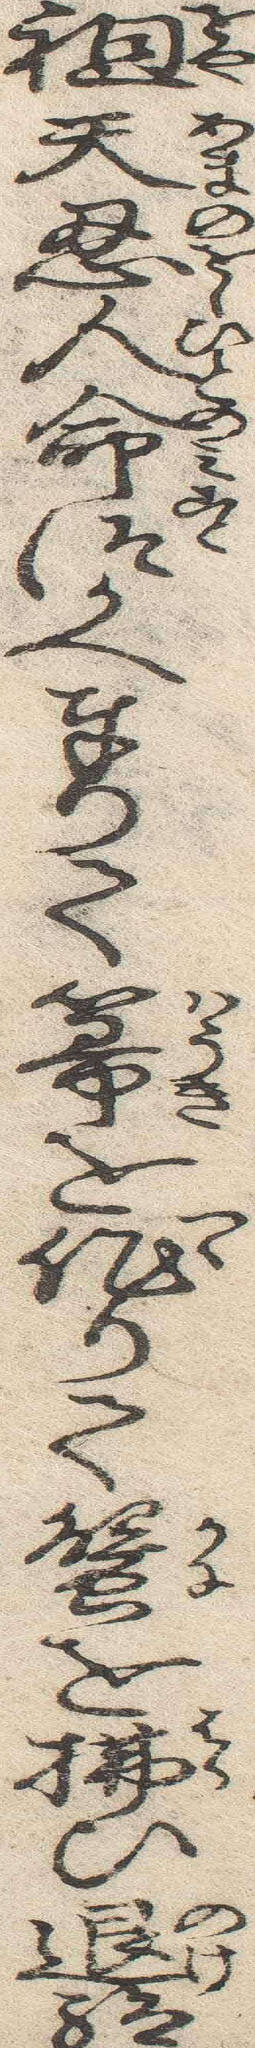祖天忍人命つかへ奉りて箒を作りて蟹を拂ひ退給
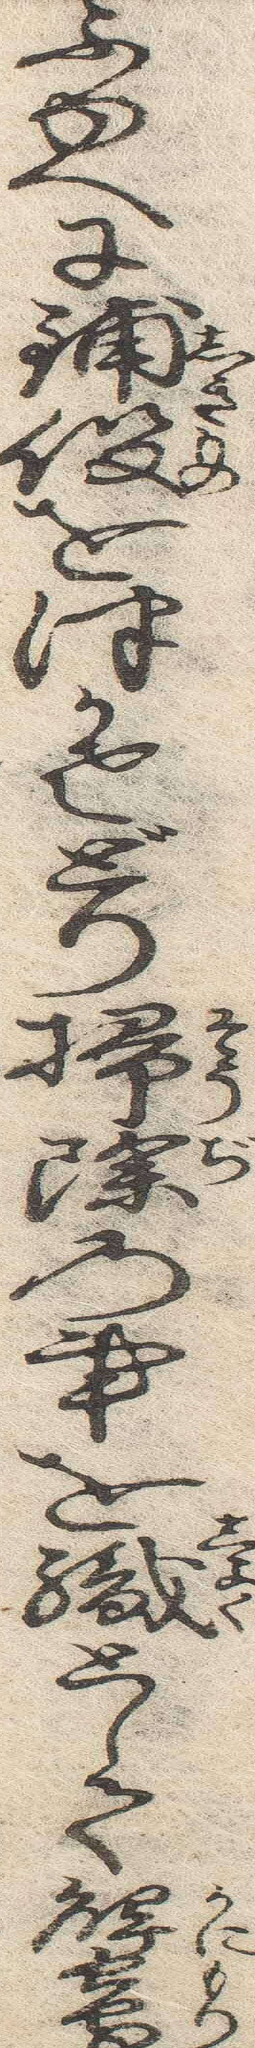ふゆへに鋪役をつかさどり掃除の事を職として蟹守
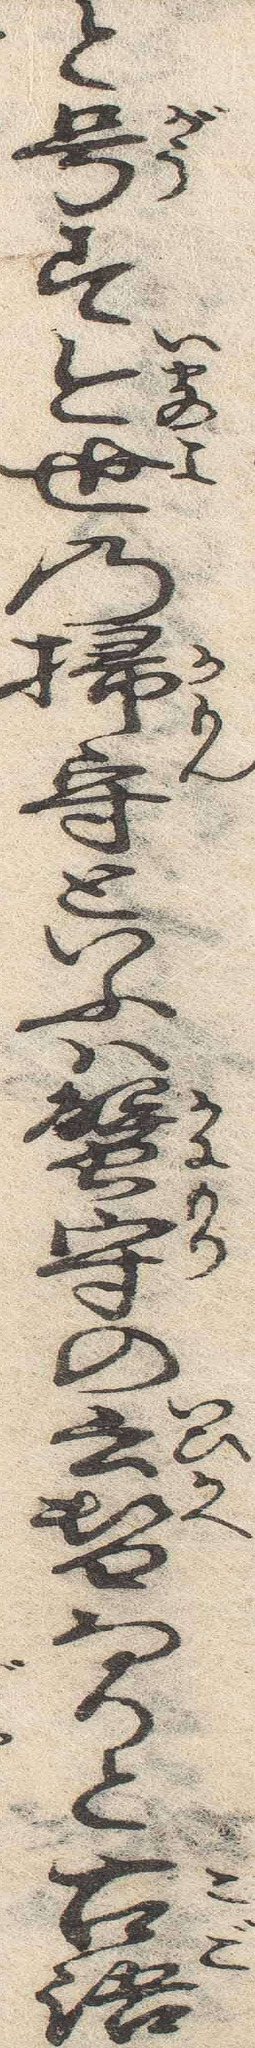と号す今世の掃守といふは蟹守の云替なりと古語
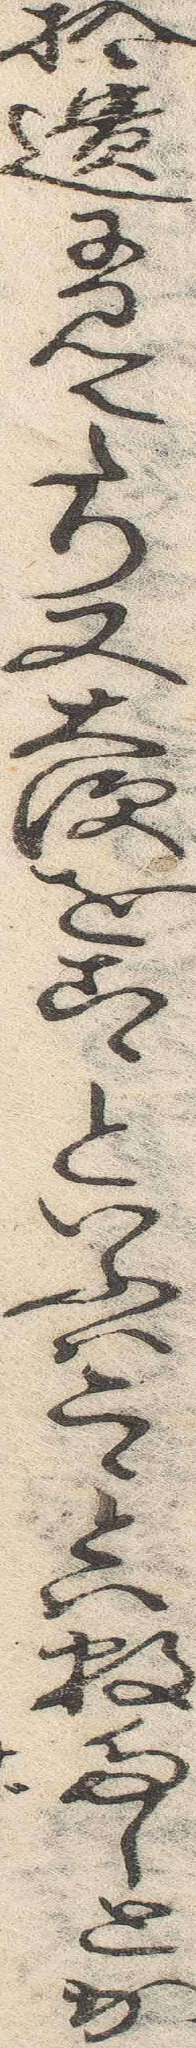拾遺に見えたり又大便をこゝといふはこゝとは数多しとか
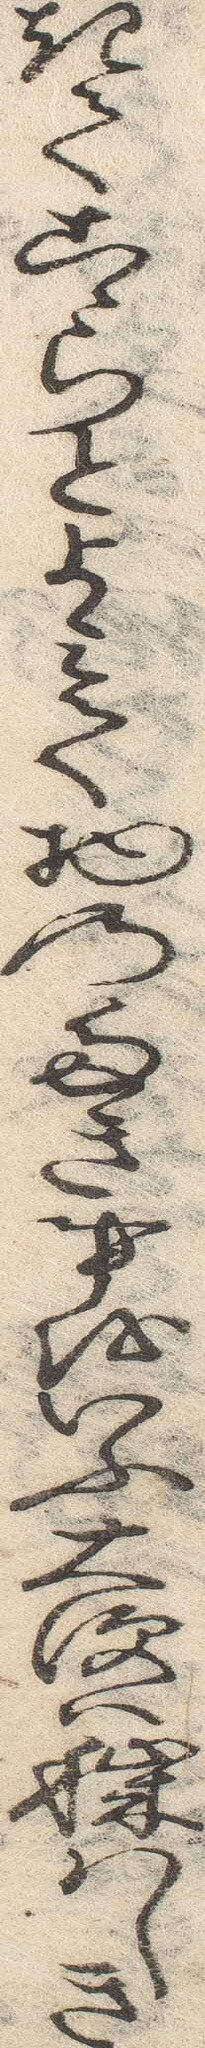きてこゝらとよみて物の多き事をいふ大便は穢はしき
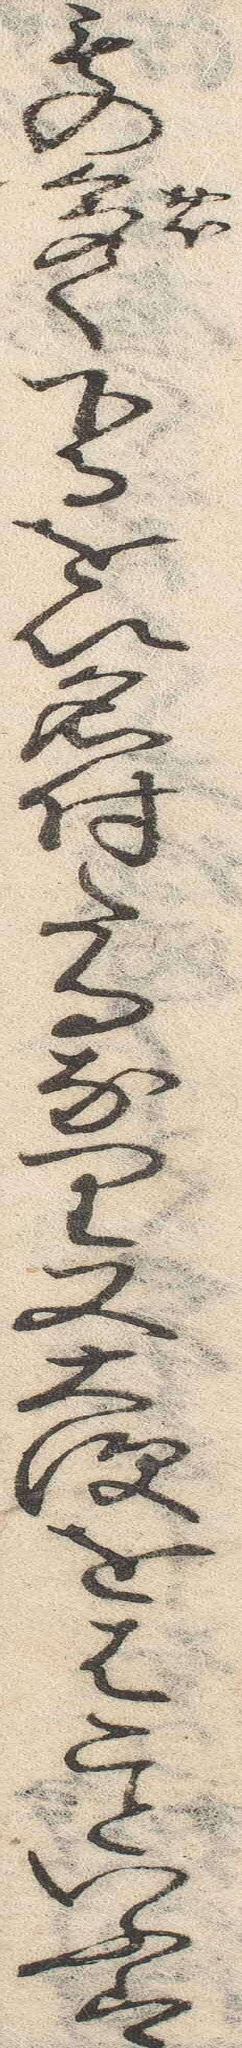もの多く下るを以名付たるなり又大便をはこといふは
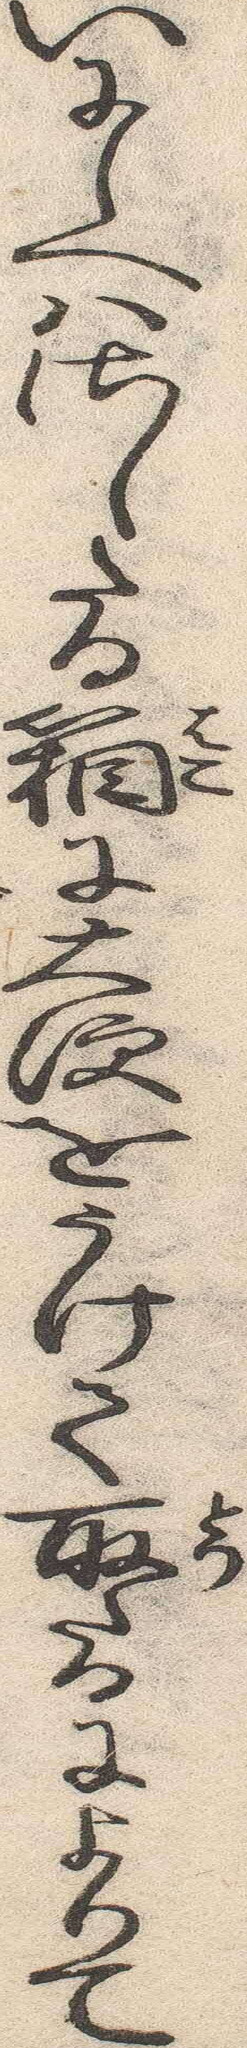いにしへはさしたる箱に大便をうけて取たるによりて
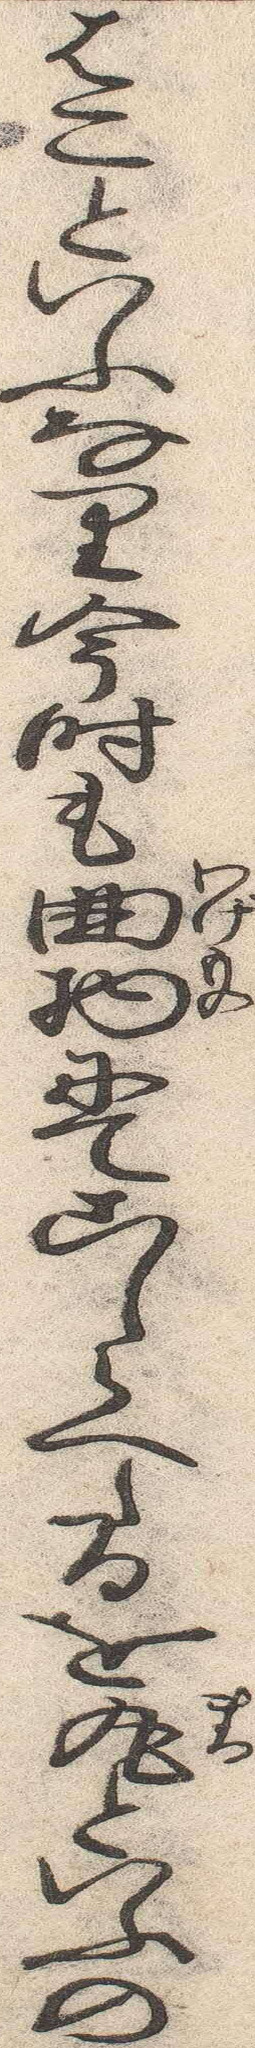はこといふなり今時も曲物にてこしらへたるを丸といふの
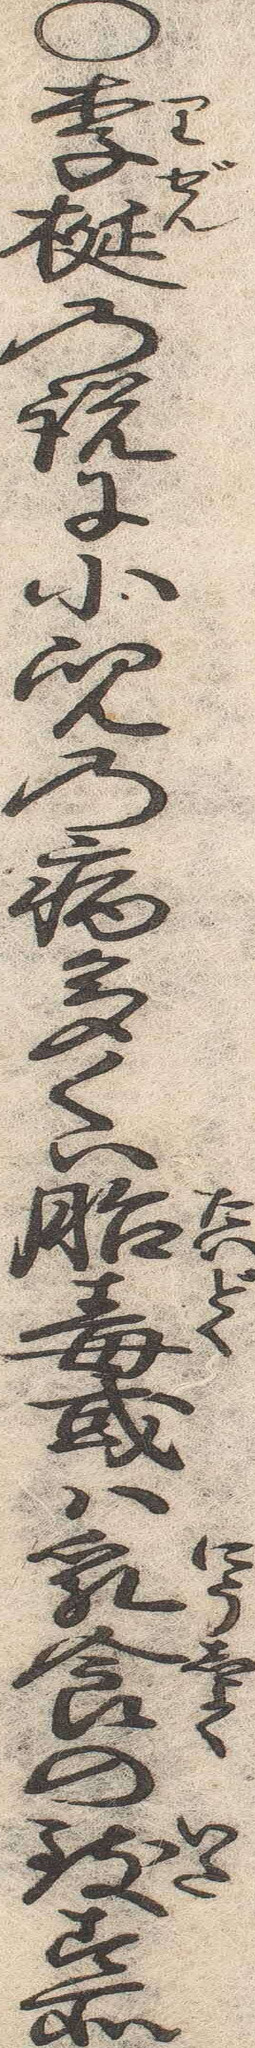◯李梴の説に小児の病多くは胎毒或は乳食の致す所
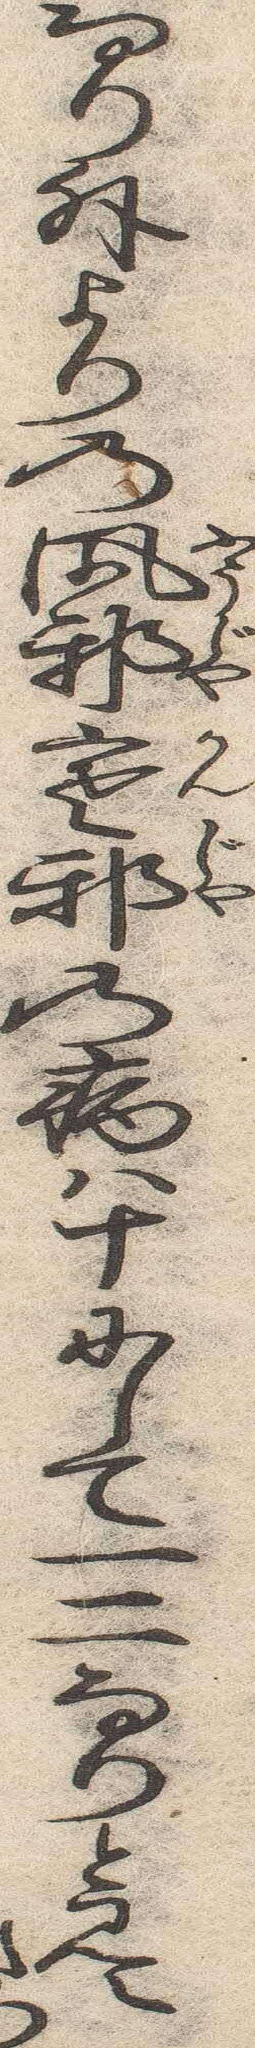なり外よりの風邪寒邪の病は十にして一二なりと見えたり
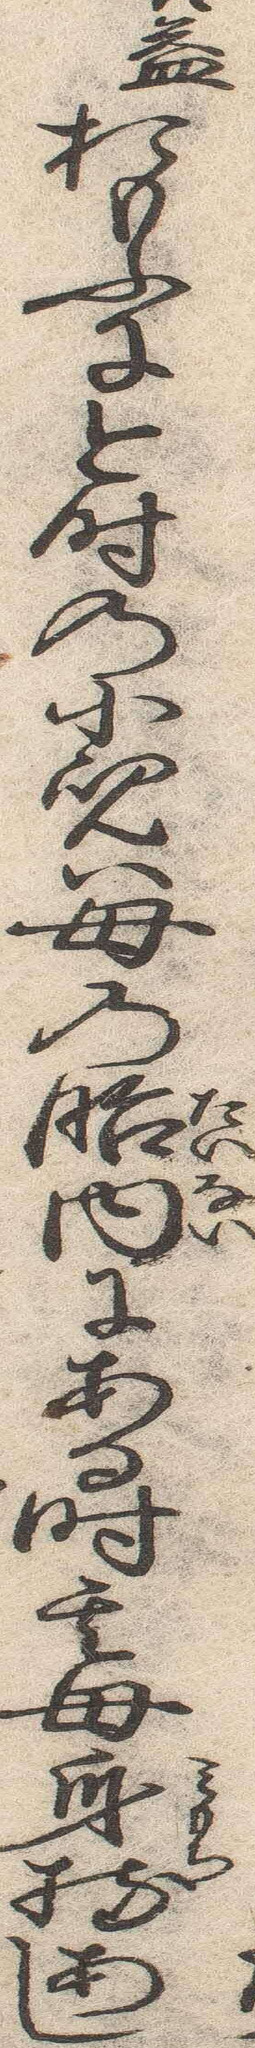啓益おもふに今時の小児は母の胎内にある時其母身持あし
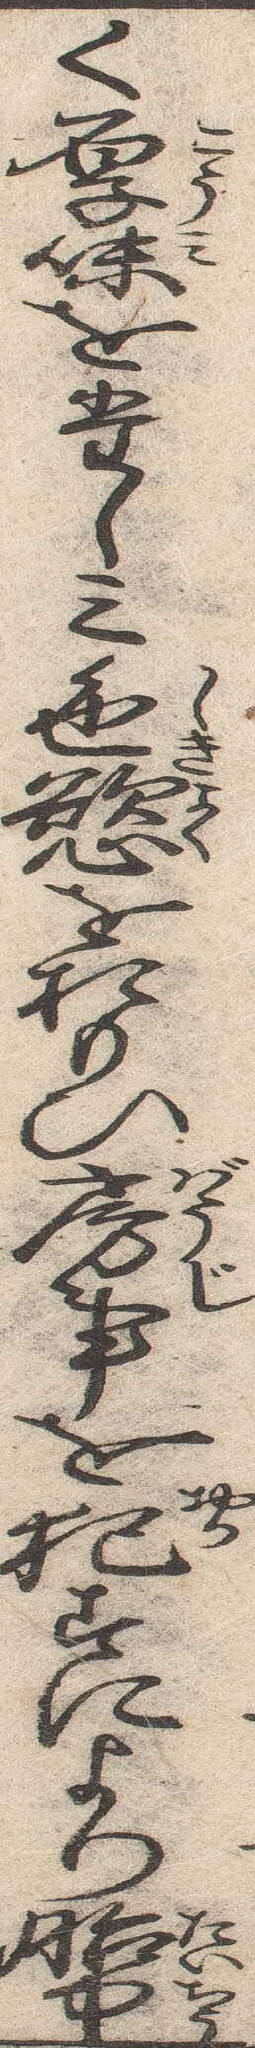く厚味をたしみ色慾をおもひ房事を犯すにより胎中
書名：小児必用養育草
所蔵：東京学芸大学附属図書館 国文学研究資料館
